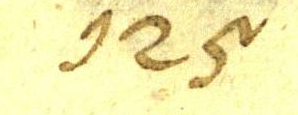125
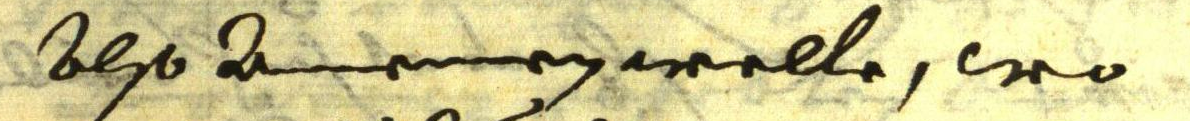Also Annemen welle, wo
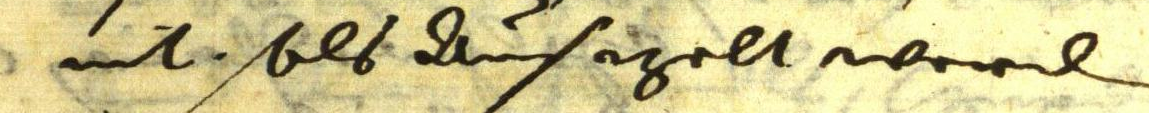nit. sols aūszelt werd.
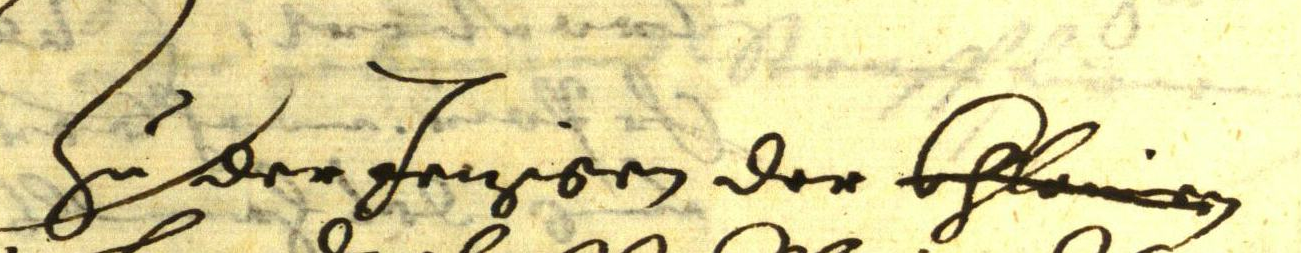Zū der Jezigen der khlainen
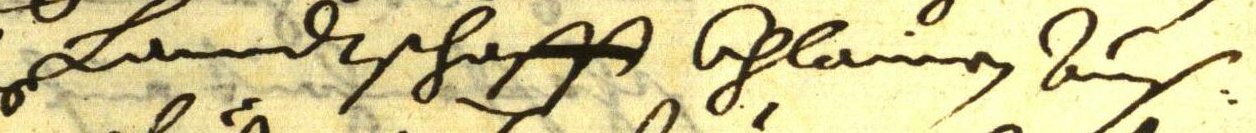Lanndtschafft khlainen Aūs¬
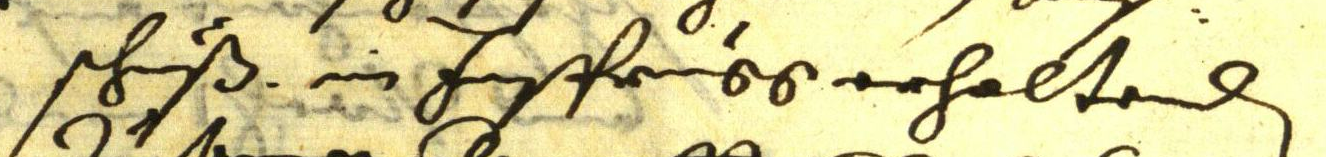schūß. in InsPrūgg erhaltend
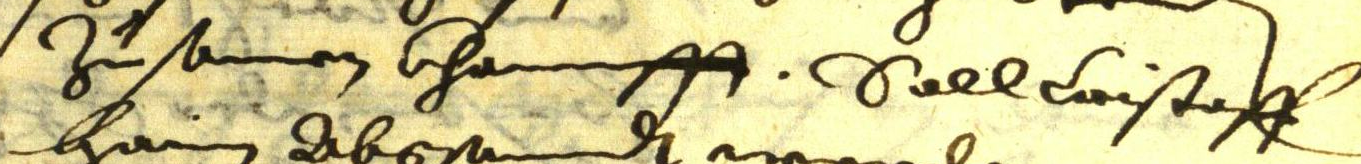Zūsamen khonnfft. Soll Cristoff
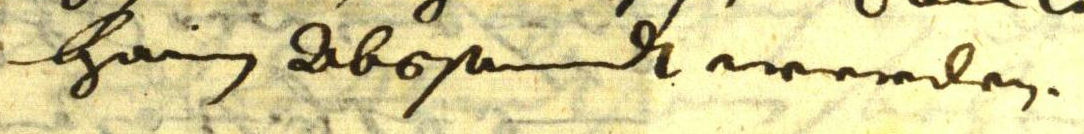Haim Abgesanndt werden.
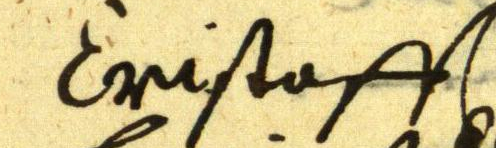Cristoff
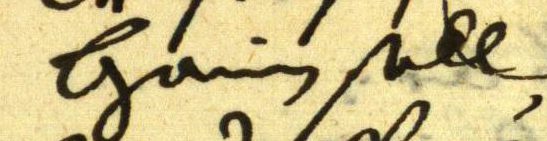Haim soll
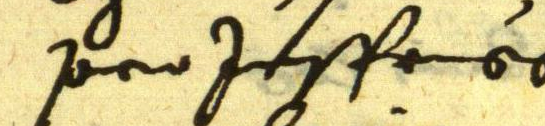per InsPrūgg
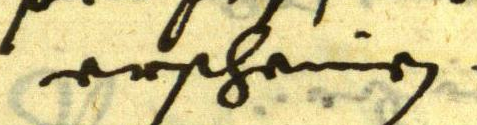erscheinen.
